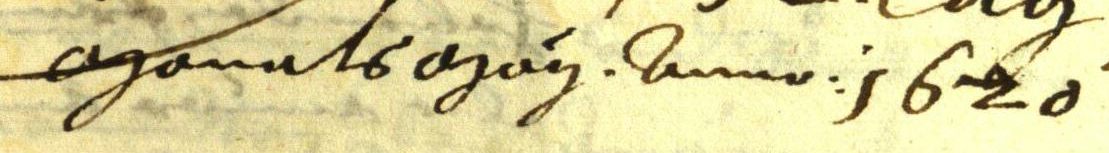Monats Maȳ. Anno: 1620.t
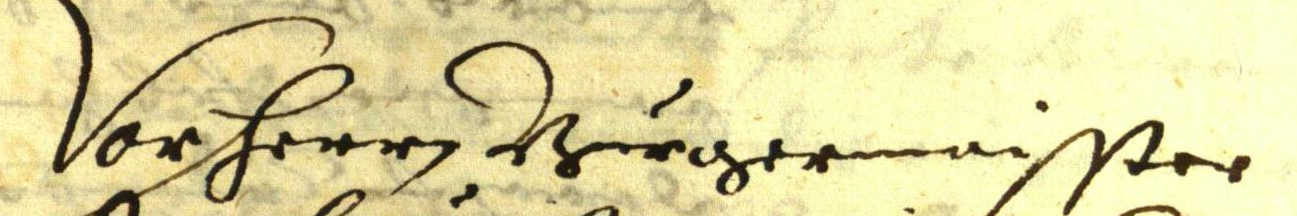Vor herrn Būrgermaisster
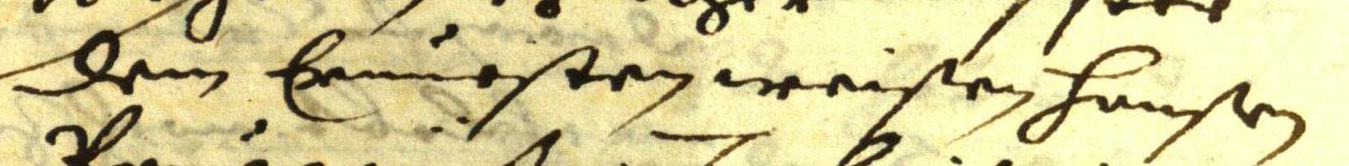dem Ernūesten weisen hansen
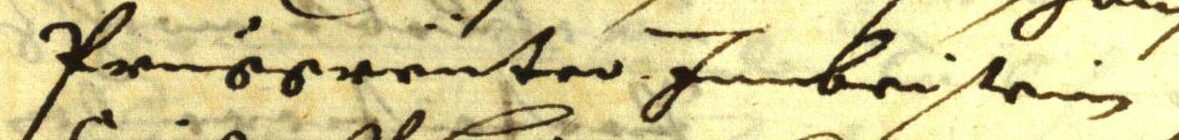Prūggreüter. Innbeisein
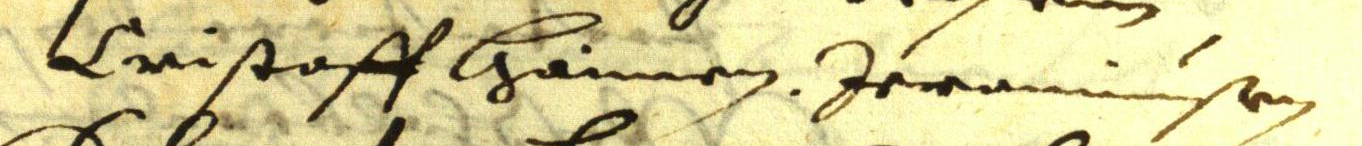Cristoff Haimen. Jeronimūsen
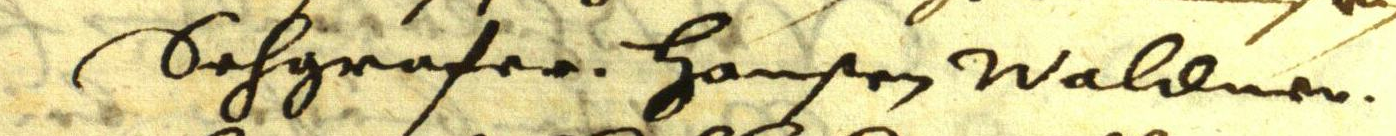Schgrafer. Hansen Waldner.
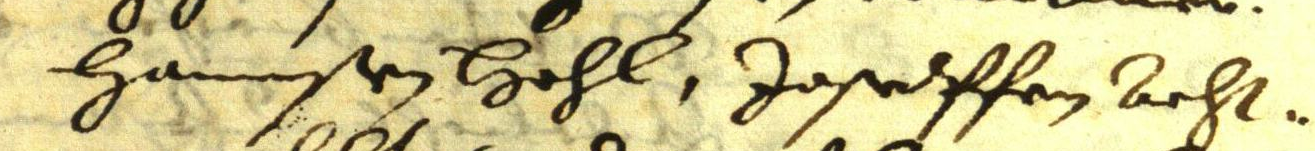Hannsen Hehl, Joseffen Acht¬
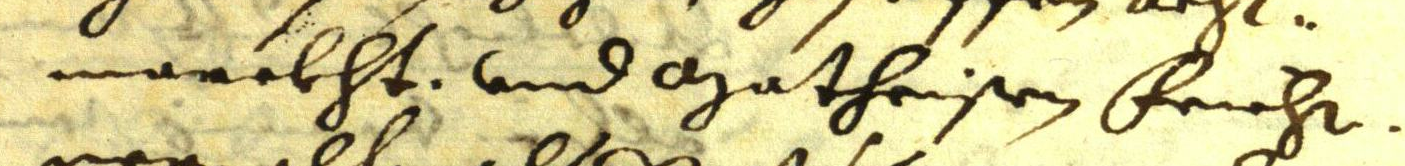marckht. vnd Matheisen Feicht¬
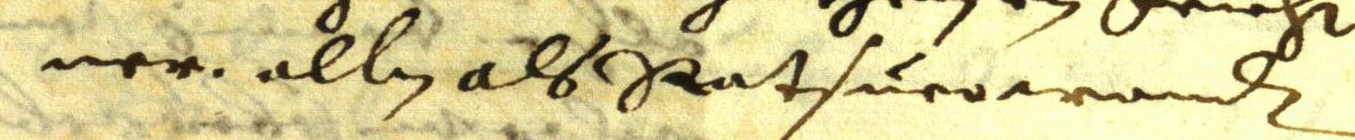ner. alln als Ratsūerwandt
